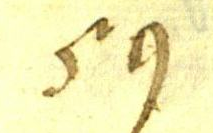59
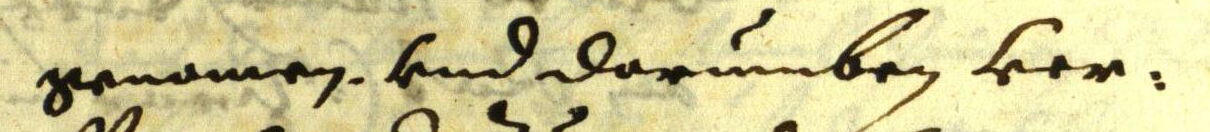genomen. vnd darūmben ver¬
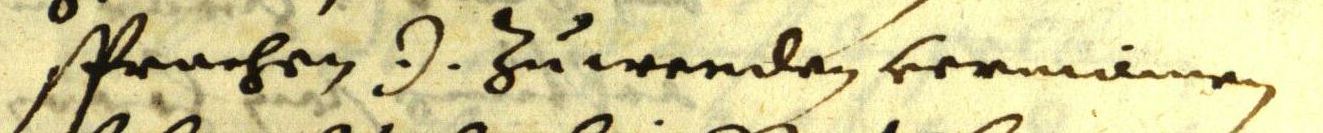sprochen.). Zū werden vermainen
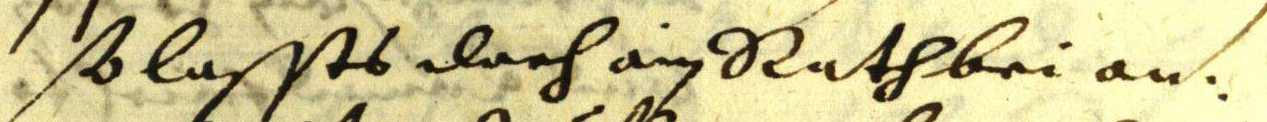so lassts doch ain Rath bei an¬
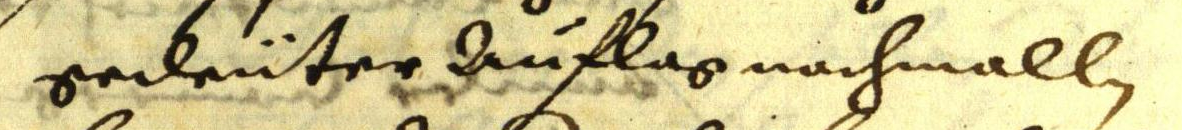gedeüter Aūflag nochmalln
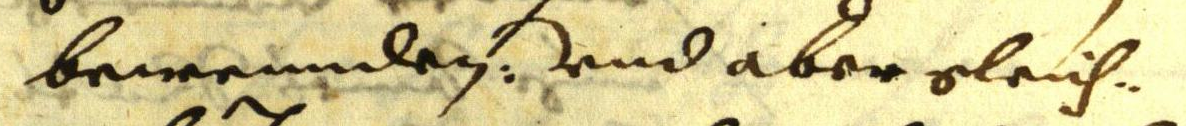bewennden: vnd aber gleich¬
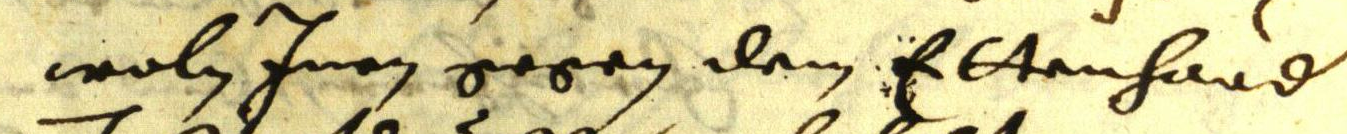woln Inen gegen dem Ettenhard
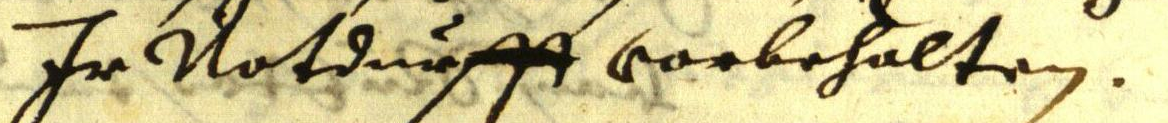Ir Notdūrfft vorbehalten.
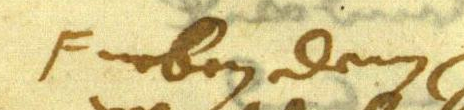neben dem
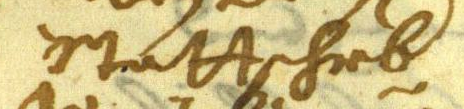Stattschrb
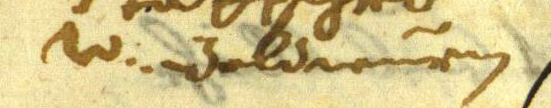W. Goldwūrm
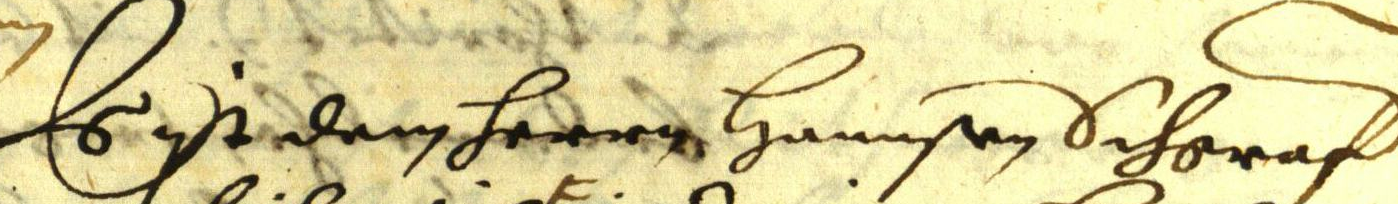Es ist dem herrn Hannsen Schgraf
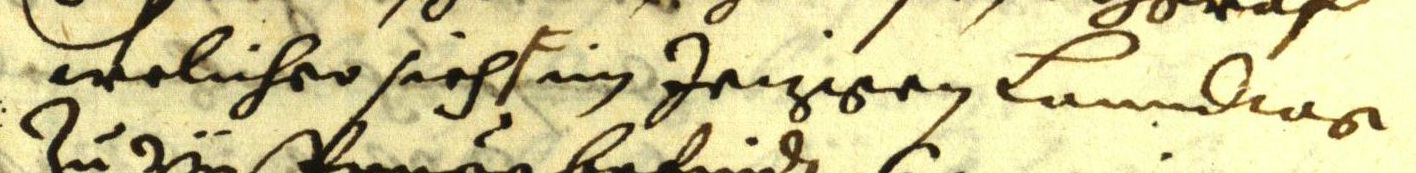welicher sich im Jetzigen Lanndtag
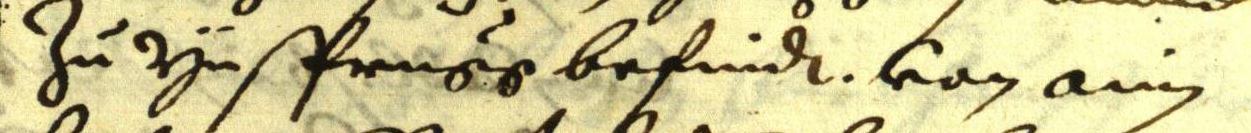Zū YnsPrūgg befindt. von aim
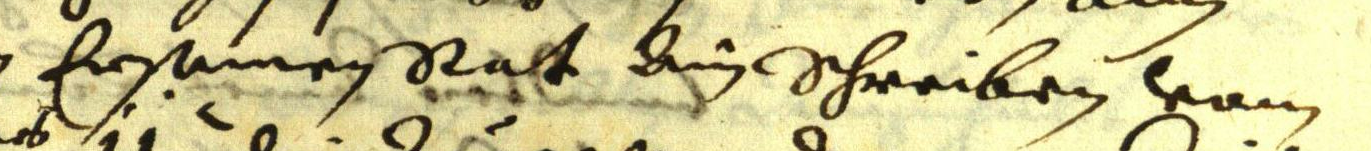Ersamen Rat Ain Schreiben vom
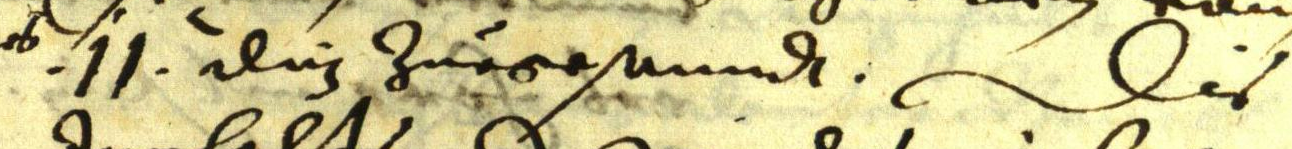.11. diz Zūegesanndt. Dis
